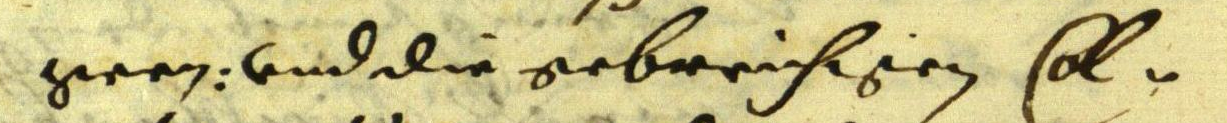geen: vnd die gebreichigen Col¬
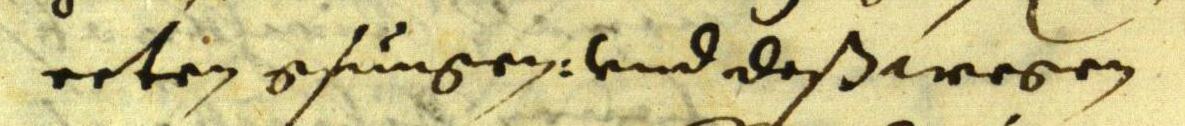ecten gsūngen: vnd deßwegen
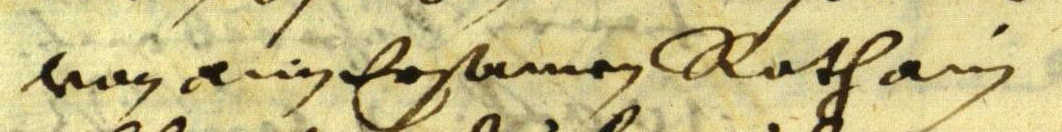von aim Ersamen Rath ain
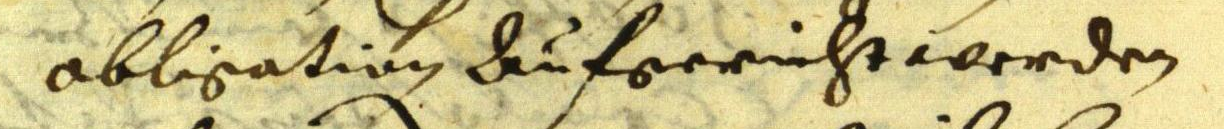obligation Aūfgericht werden
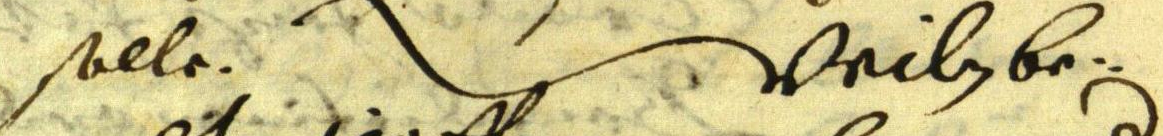solle. Weiln be¬
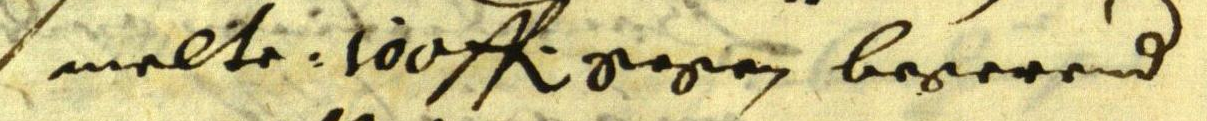melte: 100 fl. gegen begerend
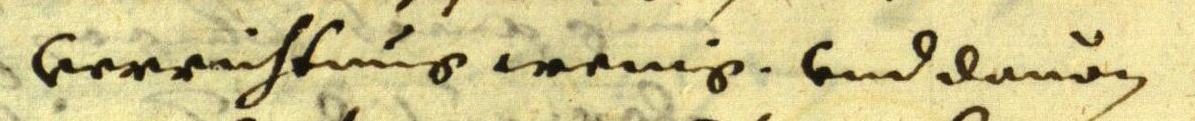verrichtūng wenig. vnd davōn
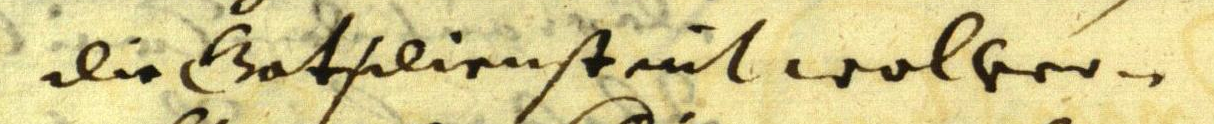die Gotsdienst nit wol ver¬
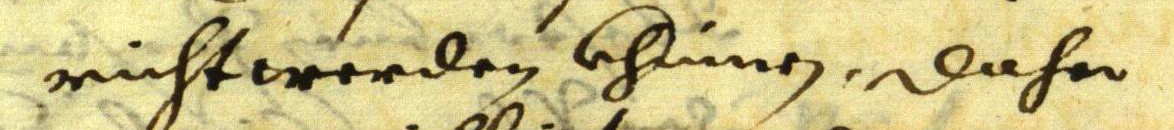richt werden khūnen. daher
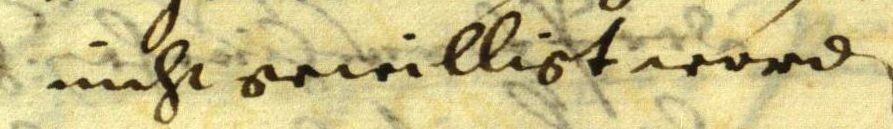nicht gewilligt word.
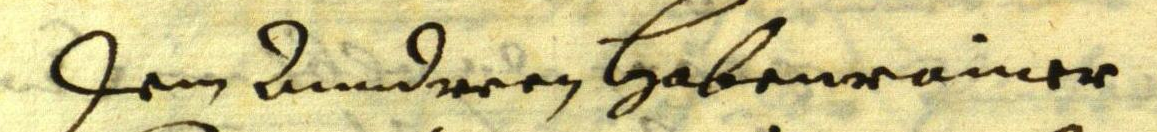Dem Anndreen Habenrainer
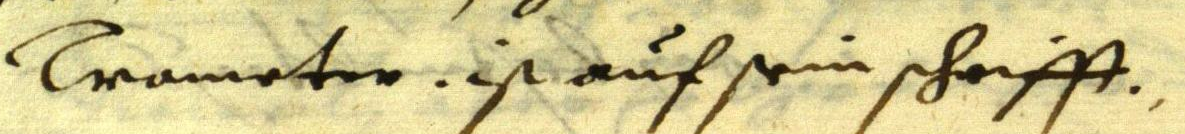Trameter. ist aūf sein schrifft¬
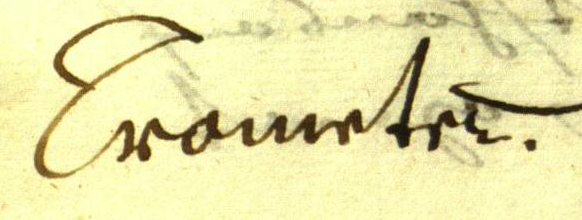Trameter.
